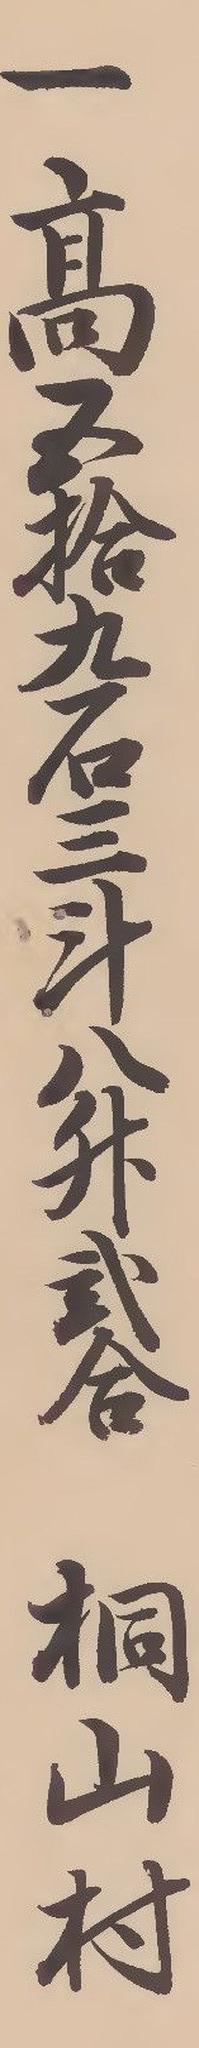一高五拾九石三斗八升弐合桐山村

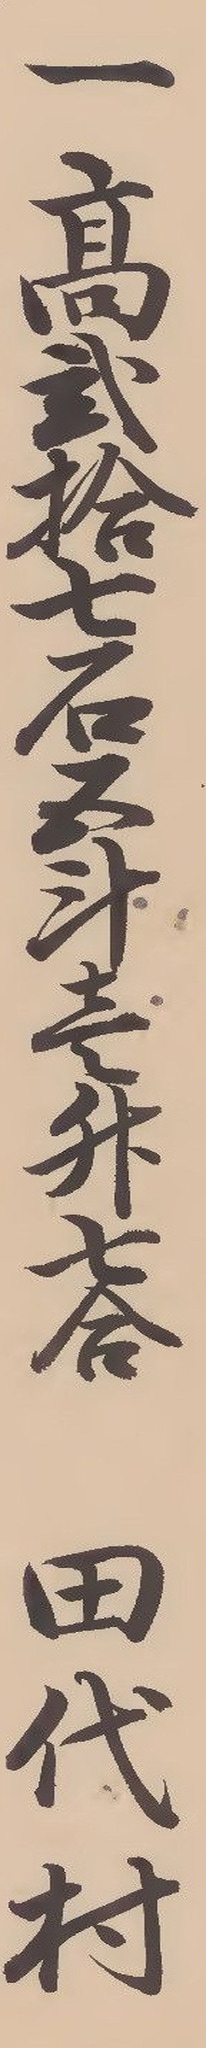一高弐拾七石五斗壱升七合田代村
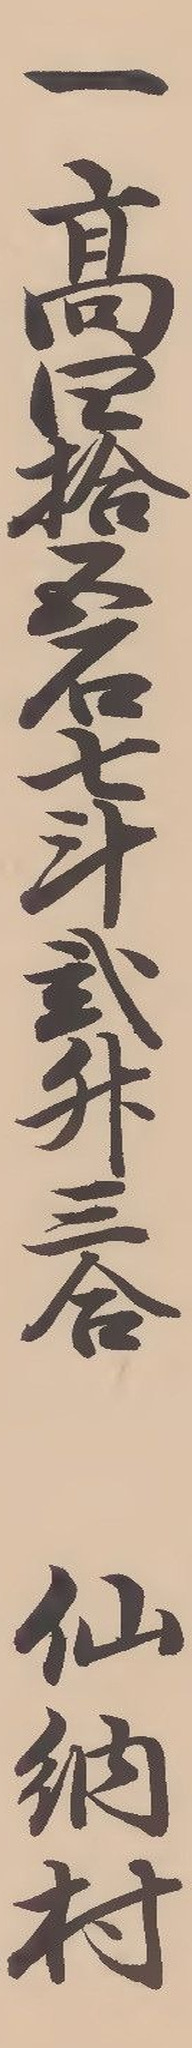一高四拾五石七斗弐升三合仙納村
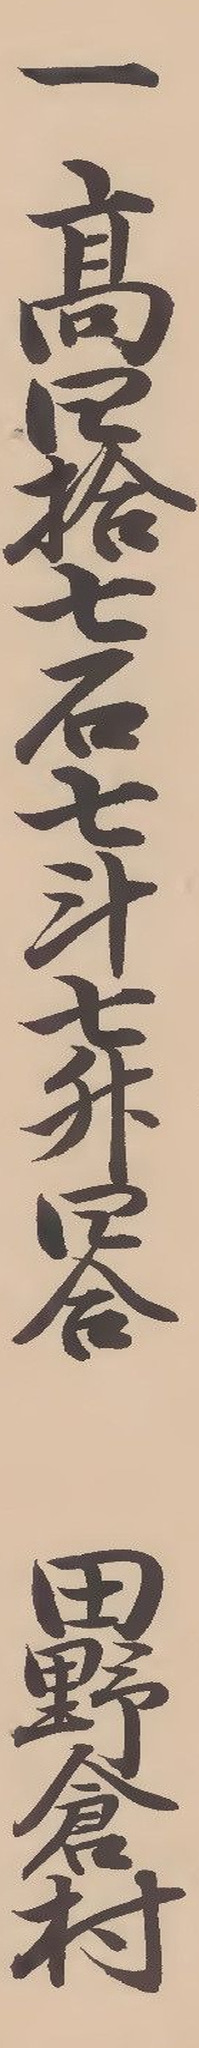一高四拾七石七斗七升四合田野倉村
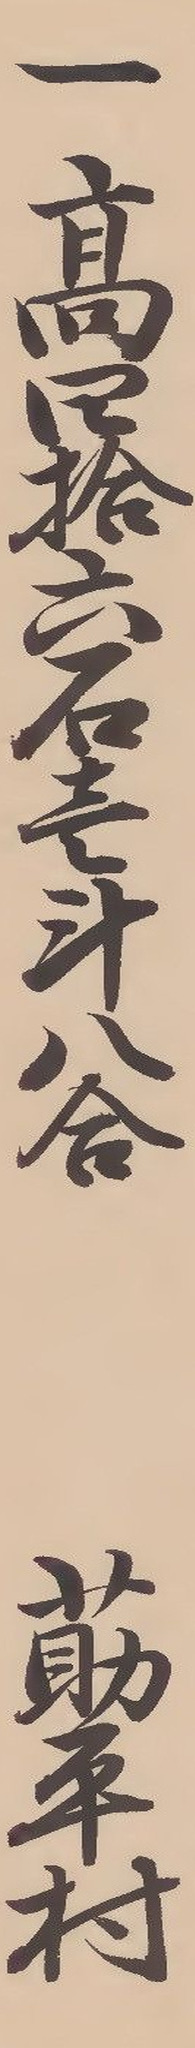一高四拾六石壱斗八合莇平村
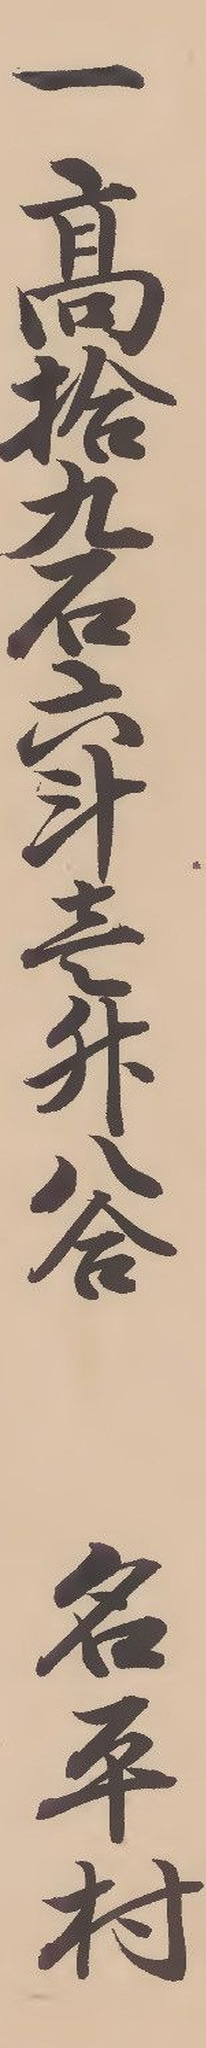一高拾九石六斗壱升八合名平村
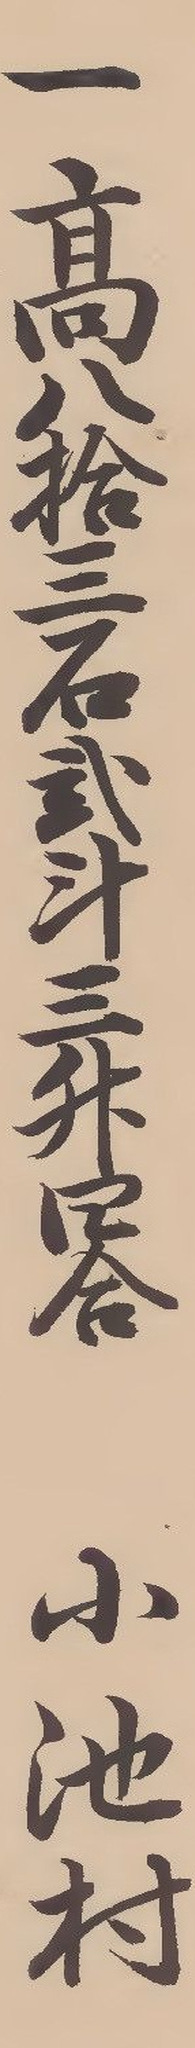一高八拾三石弐斗三升四合小池村
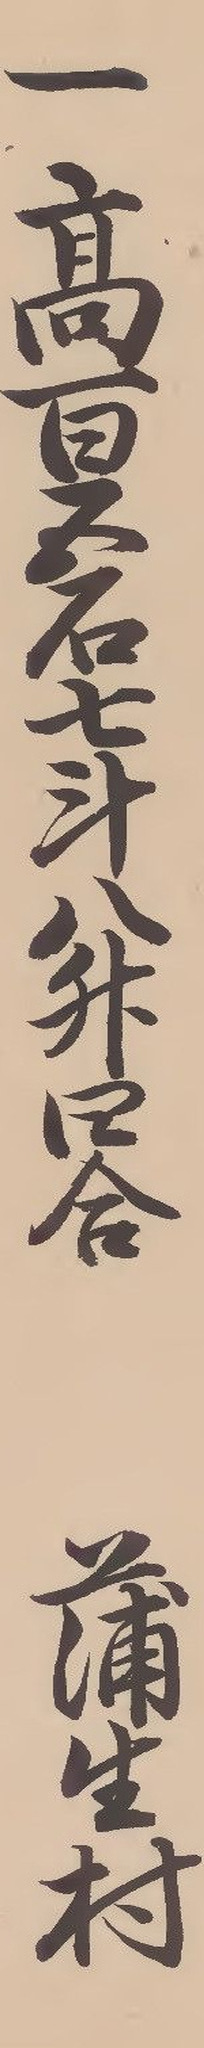一高百五石七斗八升四合蒲生村
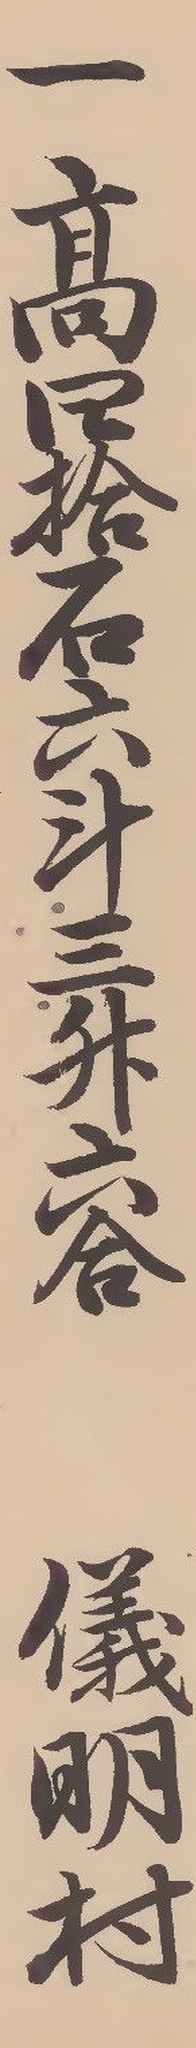一高四拾石六斗三升六合儀明村

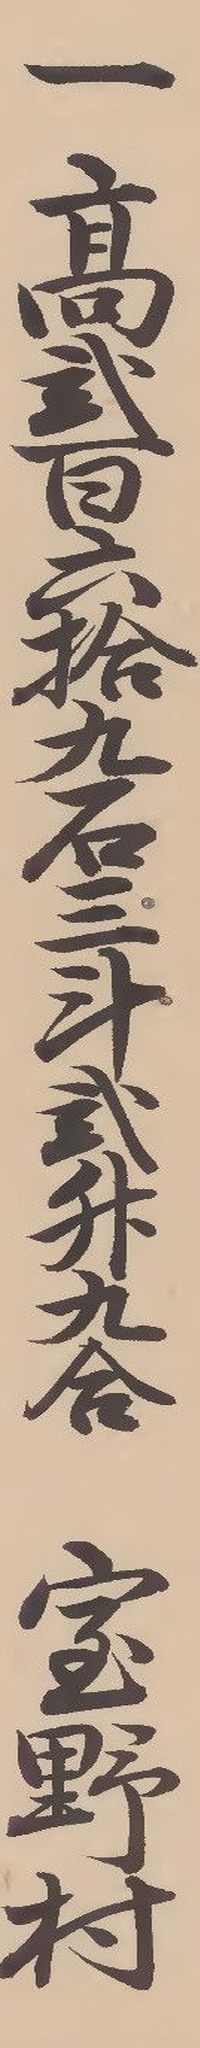一高弐百六拾九石三斗弐升九合室野村
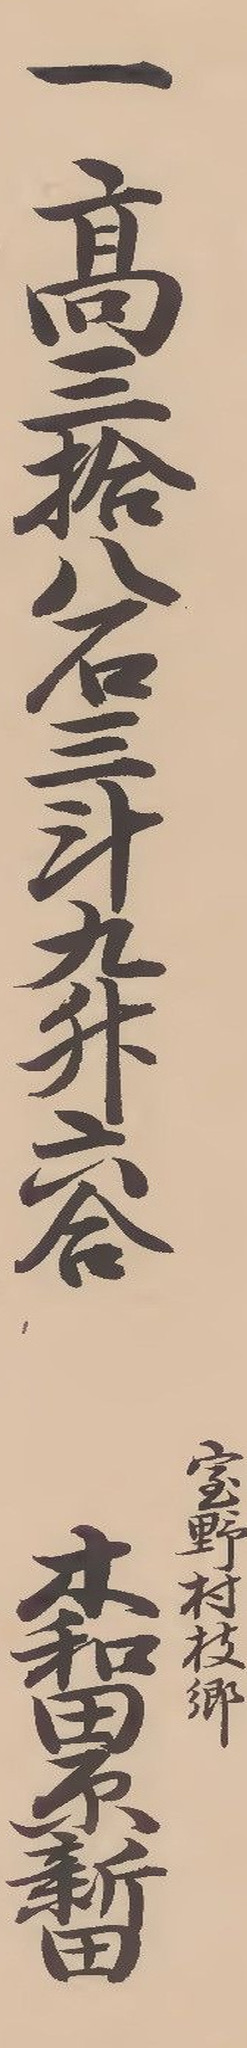一高三拾八石三斗九升六合木和田原新田
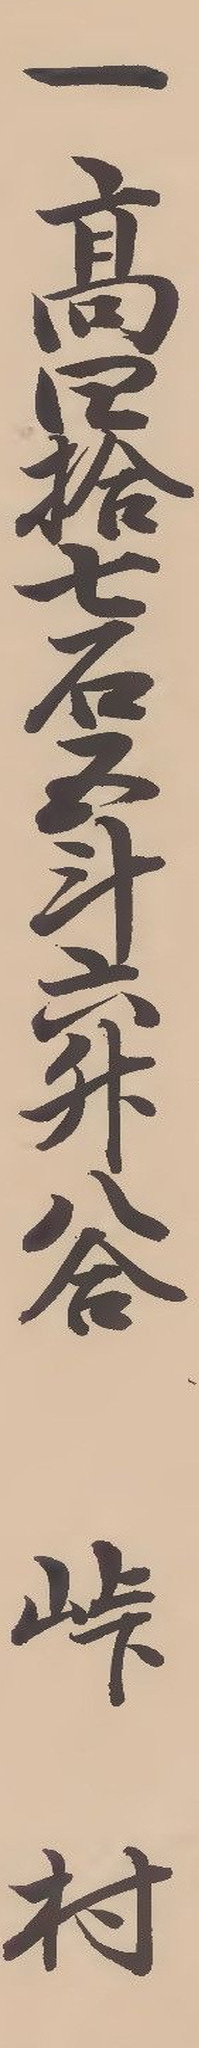一高四拾七石五斗六升八合峠村
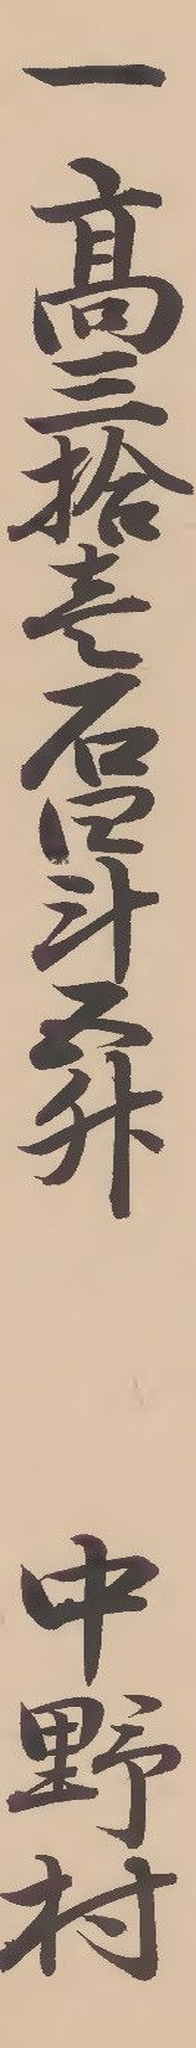一高三拾壱石四斗五升中野村
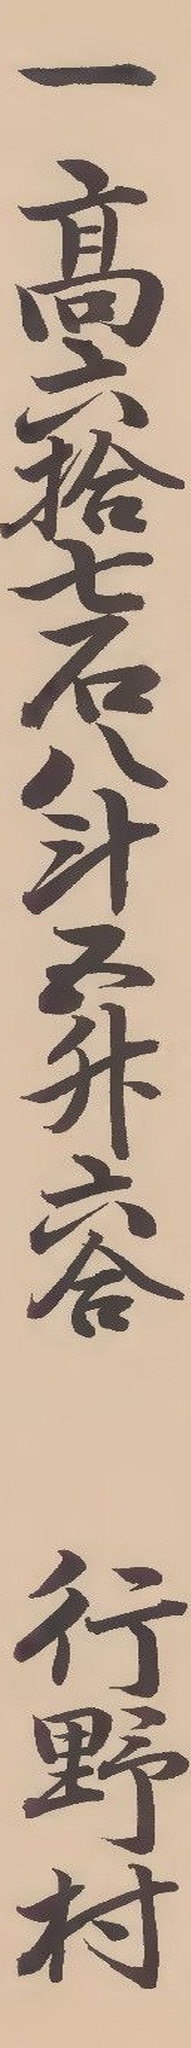一高六拾七石八斗五升六合行野村
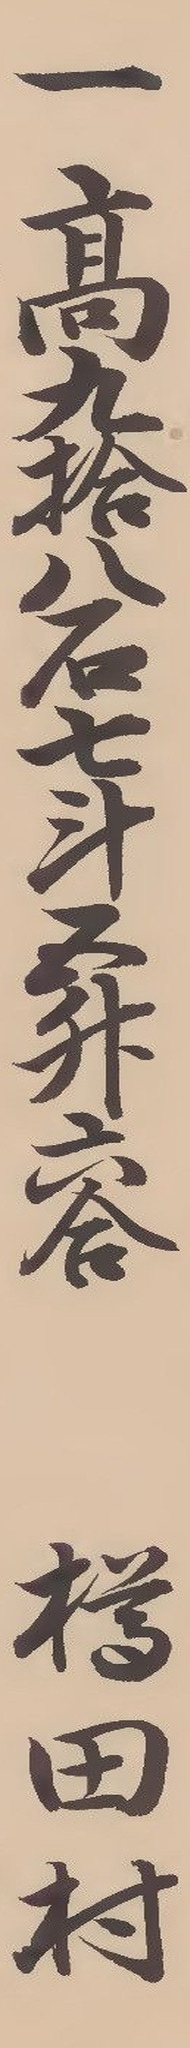一高九拾八石七斗五升六合樽田村
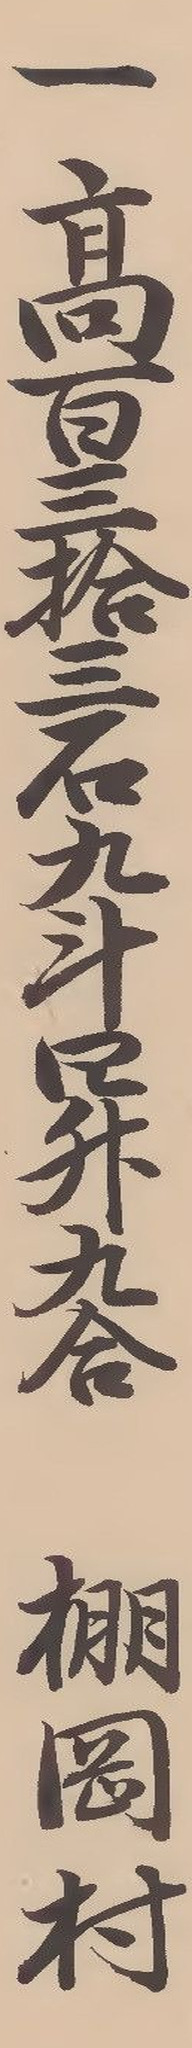一高百三拾三石九斗四升九合棚岡村
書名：越後国郷帳　上
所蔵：国立公文書館 National Archives of Japan
